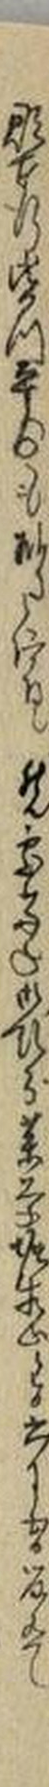郡奉行皆川平右衛門へも掛り被仰付候然ル処当年御領分薬草堀相止候旨六月五日留有之
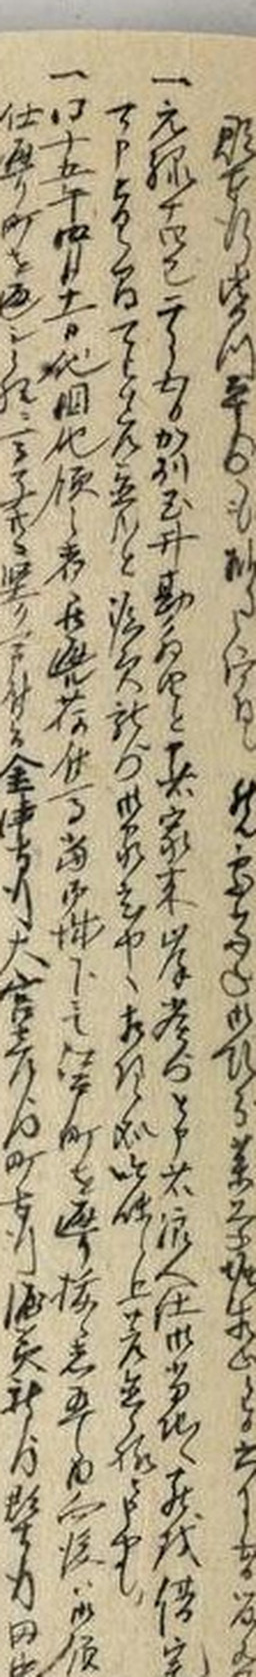可申旨候間可被差置哉と渥美新右衛門御家老中へ相伺候処吟味之上差置候様被申聞候
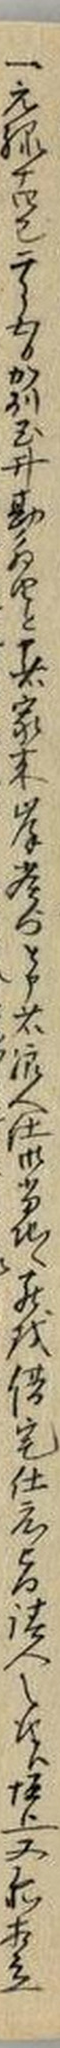一元禄十四巳二月五日加州玉井勘解由と申者家来岸常右衛門と申者浪人仕御当地へ罷越借宅仕度旨請人之儀ハ坂上又兵衛相立
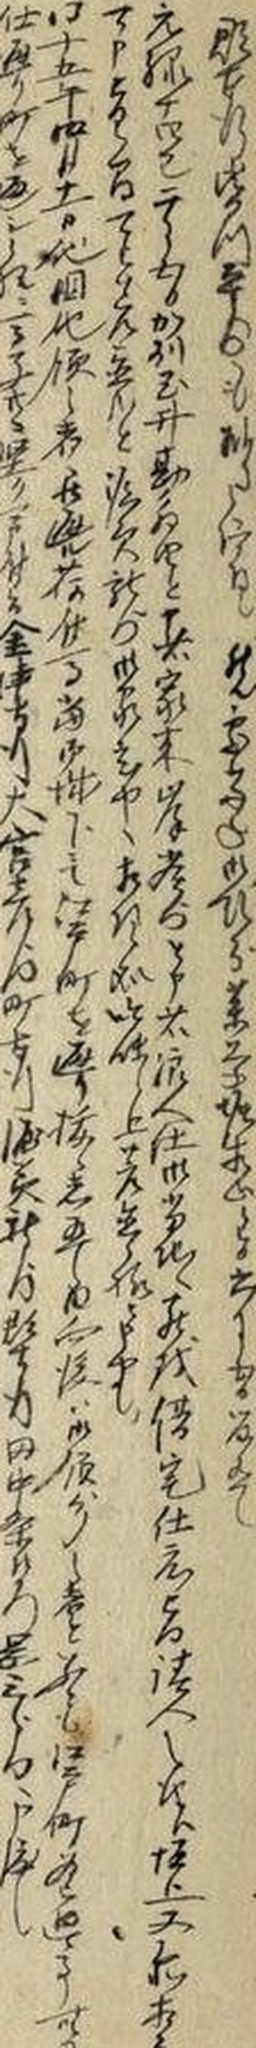可申旨候間可被差置哉と渥美新右衛門御家老中へ相伺候処吟味之上差置候様被申聞候

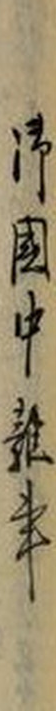御国中雑事
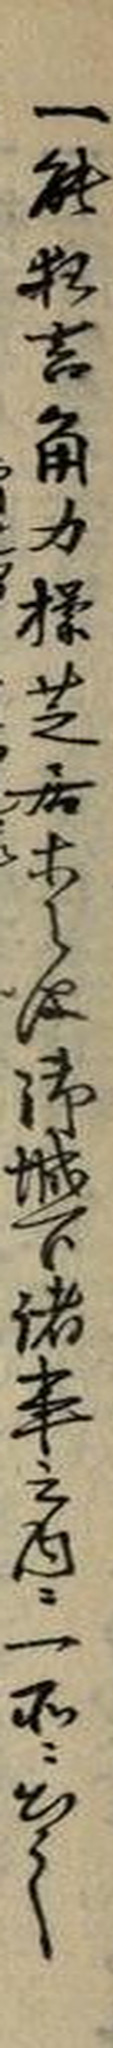一能狂言角力操芝居等之儀御城下諸事之内ニ一所ニ出之
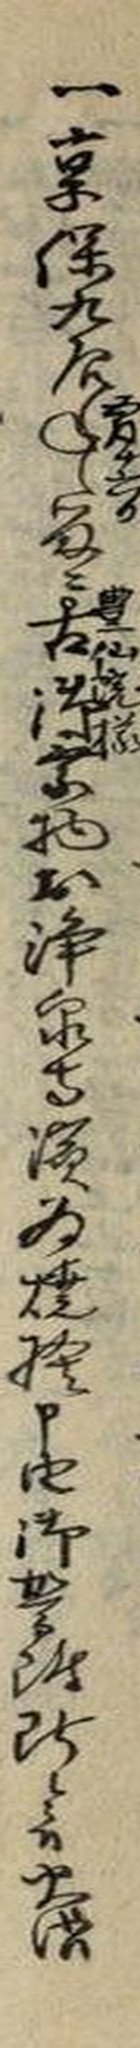一享保九辰年五月十六日之留ニ豊仙院様古御乗物於浄泉寺浜為焼捨申由御駕附断候ニ付火消
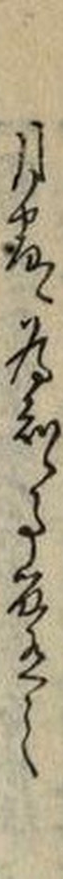月番へ為知候事留有之
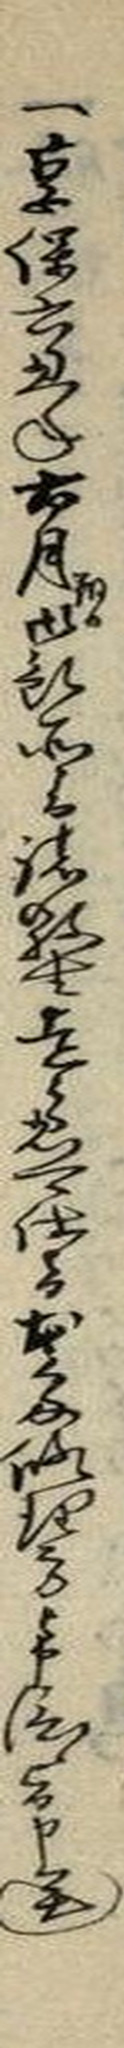一享保六丑年六月朔日預所ニ而諸殺生遠慮可仕旨本多修理方被申渡候旨申送
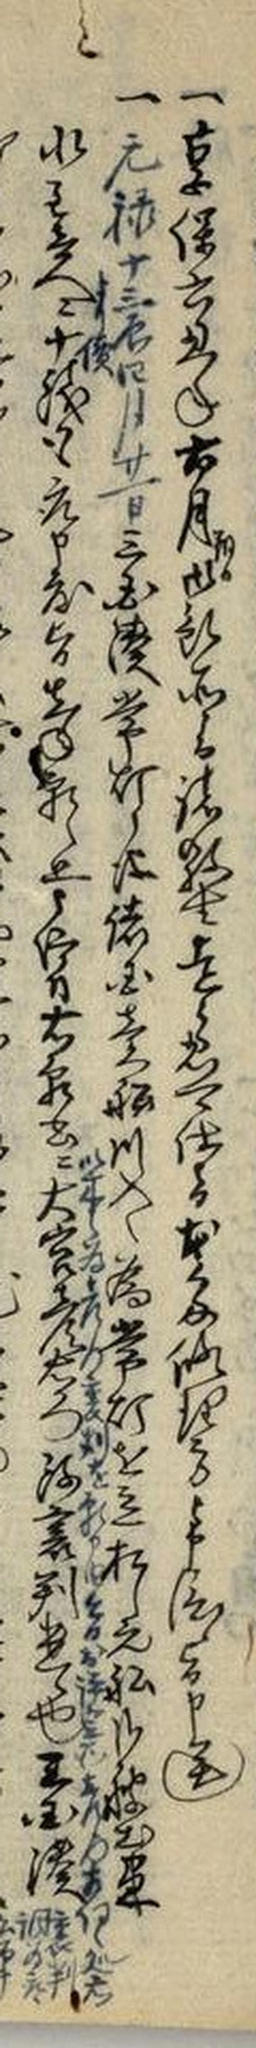一元禄十三辰四月廿一日三国湊常灯之儀諸国売船川入之為常灯を立おしえ船弐艘出来
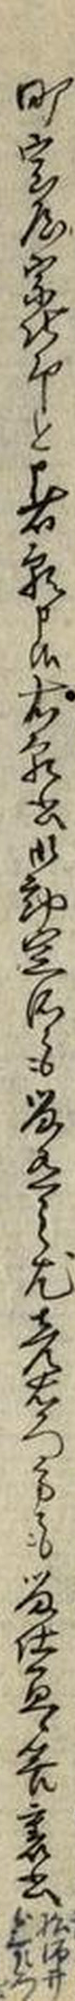町室屋宗次郎と申者願申候右願書御勘定所ニも留有之尤彦右衛門方ニも留仕置候筈裏書
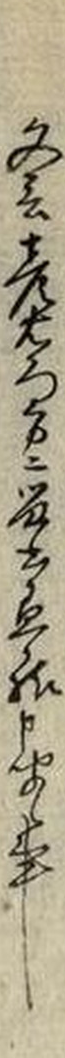文言彦右衛門方ニ留書置候様申聞候事
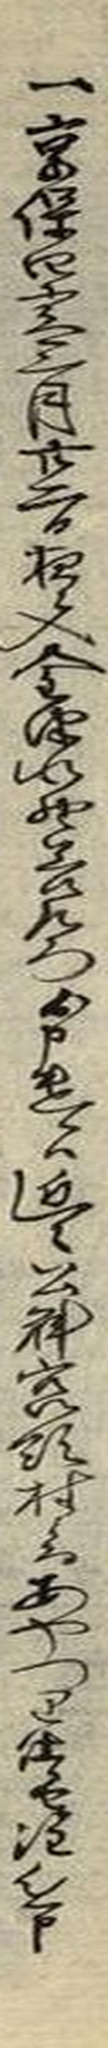一享保四亥三月廿二日夜ニ入金津水野善左衛門ゟ申遣候ハ近々公領宮領村々ニ而あやつり仕候由注進申
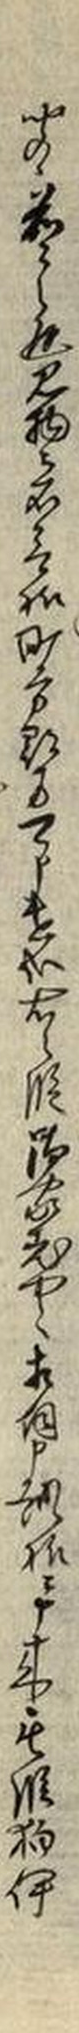聞候前々之通見物ニ不参様町方郡方可申遣哉右之段御家老中へ相伺申越候様ニ申来其段狛伊
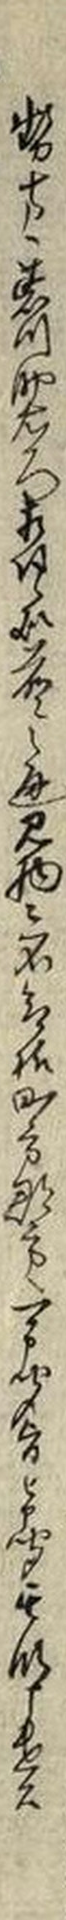勢方へ荒川助右衛門相伺候処前々之通見物ニ不参候様町方郡方へ可申聞旨被申聞其段申遣ス
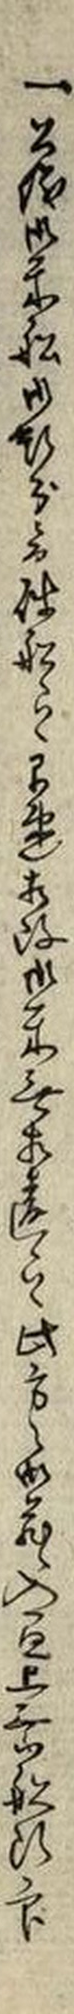一公儀御米船御領分ニ而往船候ハヽ早速相改御米無相違候ハヽ此方之御蔵へ入置上乗船頭印
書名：御国他国諸事之部
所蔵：福井県文書館 Fukui Prefectural Archives
